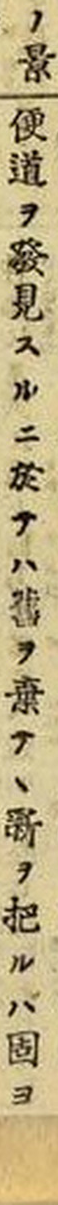便道ヲ發見スルニ於テハ舊ヲ棄テヽ新ヲ把ルバ固ヨ
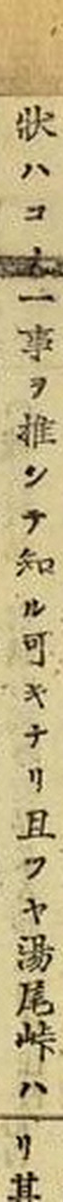狀ハコノ一事ヲ推シテ知ル可キナリ且ツヤ湯尾峠ハ
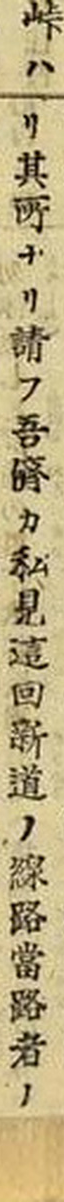リ其所ナリ請フ吾儕カ私見這回新道ノ線路當路者ノ
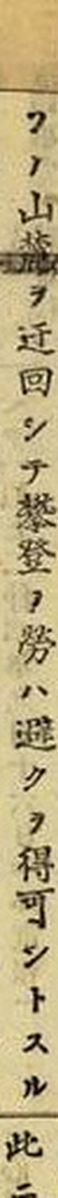ソノ山麓ヲ迂回シテ擧登ノ勞ハ避クヲ得可シトスル
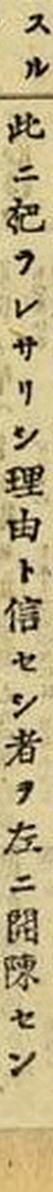此ニ把ラレサリシ理由ト信セシ者ヲ左ニ開陳セン
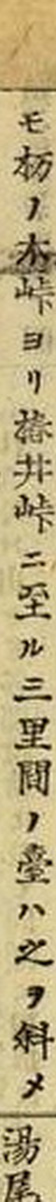モ栃ノ木峠ヨリ椿井峠ニ至ル三里間ノ壹ハ之ヲ斜メ
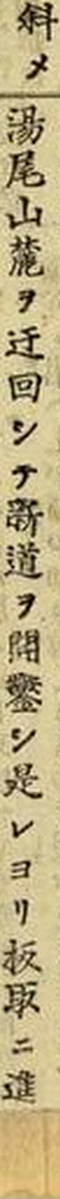湯尾山麓ヲ迂回シテ新道ヲ開鑿シ是レヨリ板取ニ進
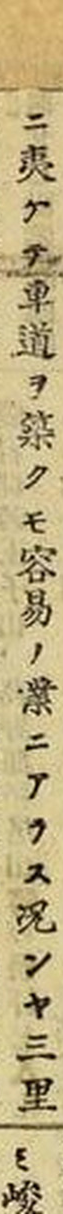ニ夷ケテ車道ヲ築クモ容易ノ業ニアラス况ンヤ三里
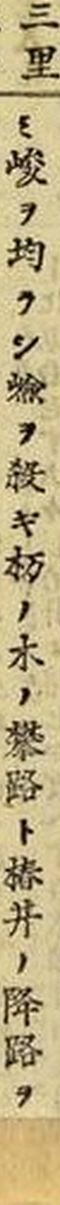ミ峻ヲ均ラシ嶮ヲ殺ギ栃ノ木ノ擧路ト椿井ノ降路ヲ
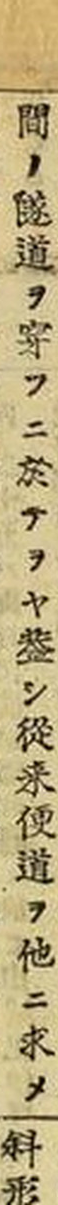間ノ隧道ヲ穿ツニ於テヲヤ蓋シ從来便道ヲ他ニ求メ
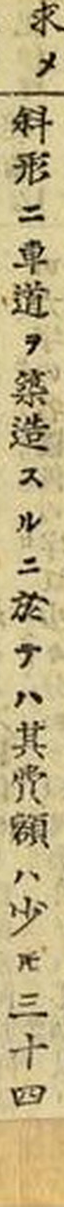斜形ニ車道ヲ築造スルニ於テハ其費額ハ少𪜈三十四
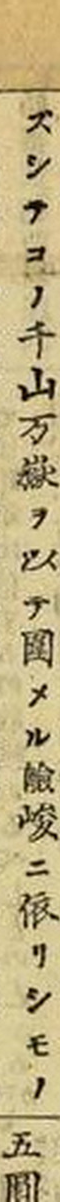ズシテコノ千山万嶽ヲ以テ圍メル險峻ニ依リシモノ
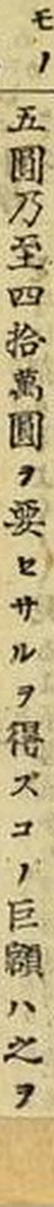五圓乃至四拾萬圓ヲ要セサルヲ得ズコノ巨額ハ之ヲ
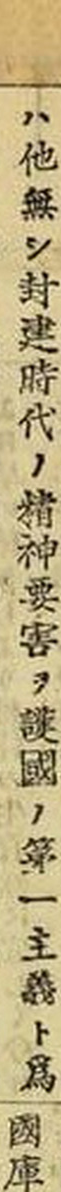ハ他無シ封建時代ノ精神要害ヲ護國ノ第一主義ト爲
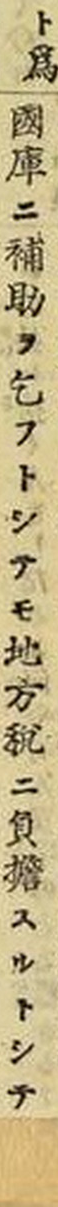國庫ニ補助ヲ乞フトシテモ地方税ニ負擔スルトシテ
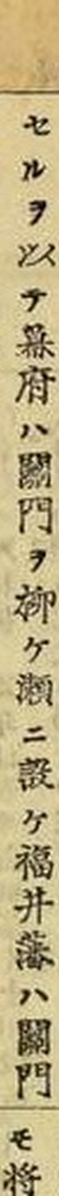セルヲ以テ幕府ハ關門ヲ柳ケ瀬ニ設ケ福井藩ハ關門
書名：温古集 五巻
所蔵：福井県文書館 Fukui Prefectural Archives
